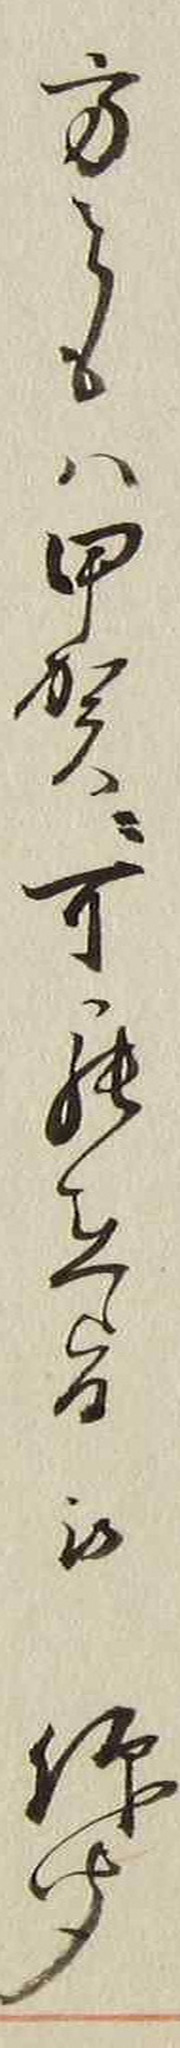方ともハ甲賀ニ可罷在旨被仰聞
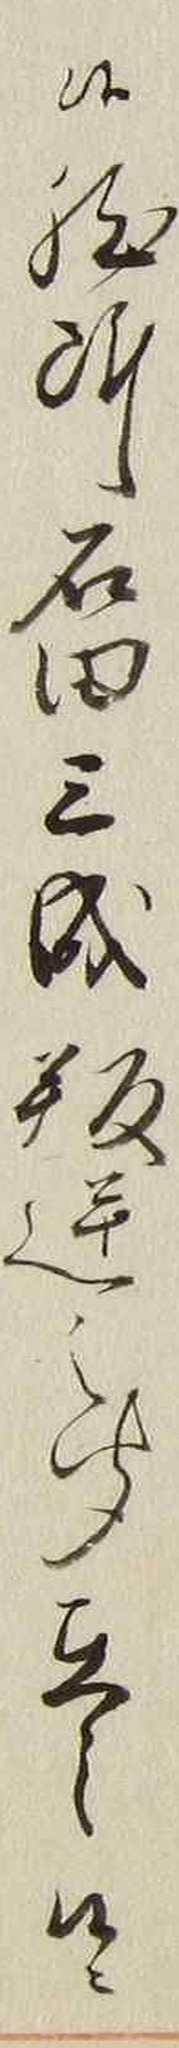候然所石田三成叛逆之聞在之候ニ
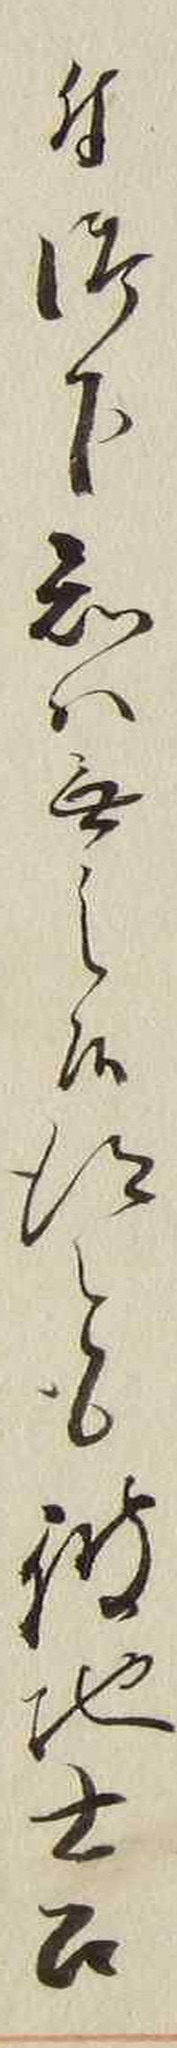付御下知ハ無之候得とも彼地士召
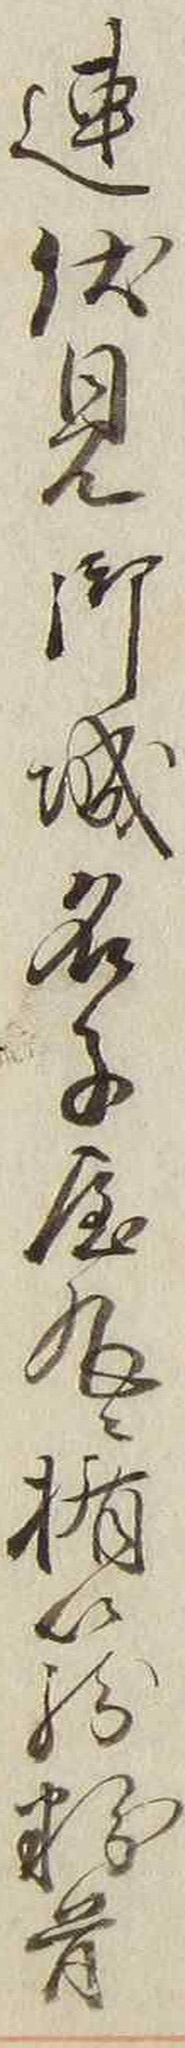連伏見御城名子屋丸ニ楯籠粉骨

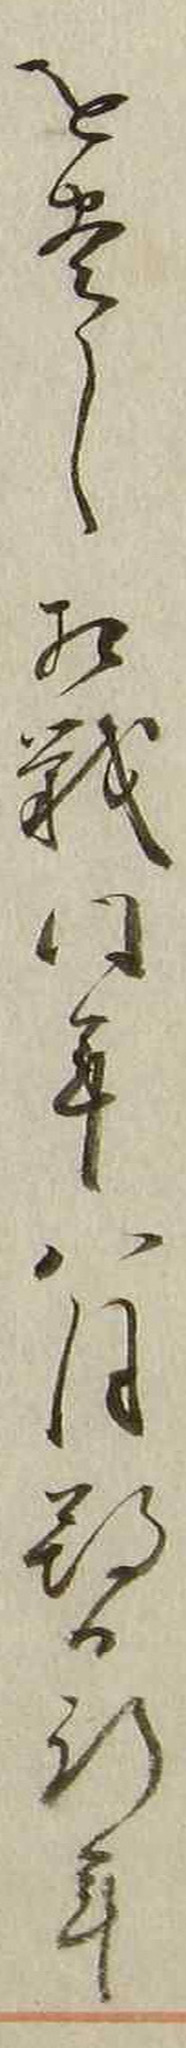を尽し相戦同年八月朔日行年
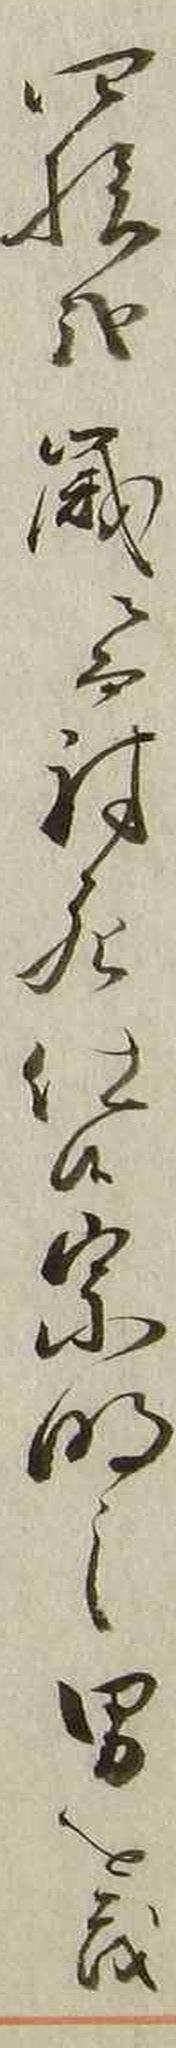四拾弐歳ニ而討死仕候宗明之男を茂
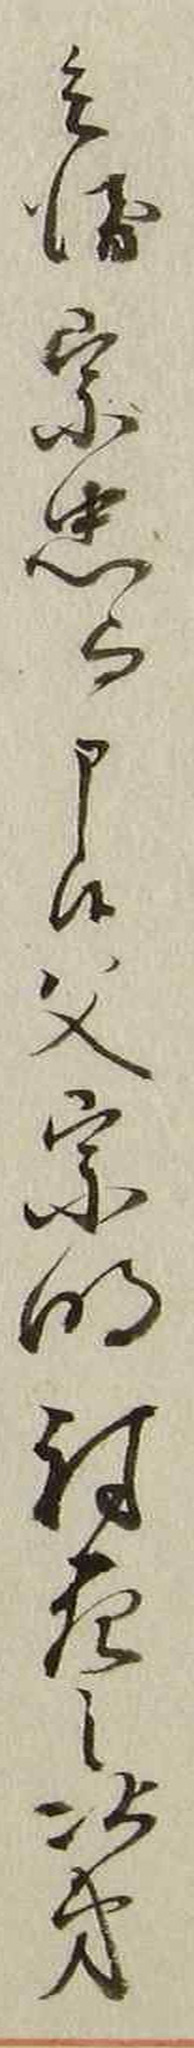兵衛宗忠と申候父宗明討死之次第
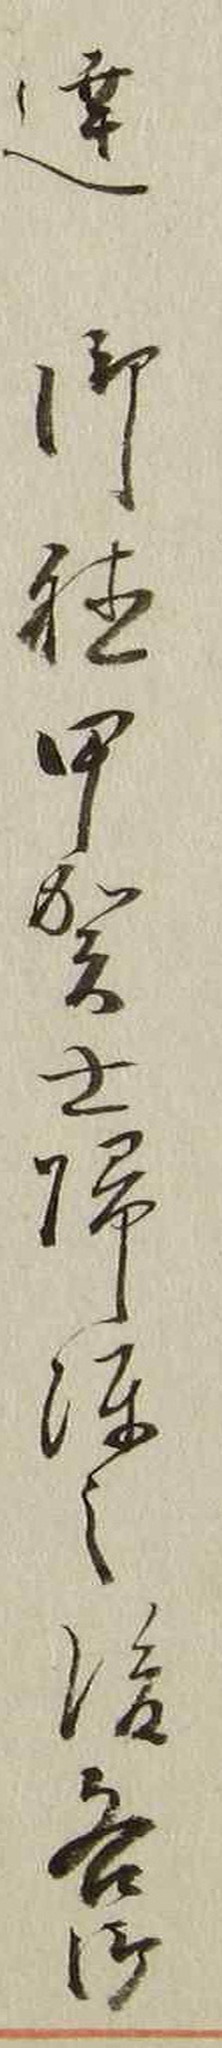達御聴甲賀士帰陣之後各御
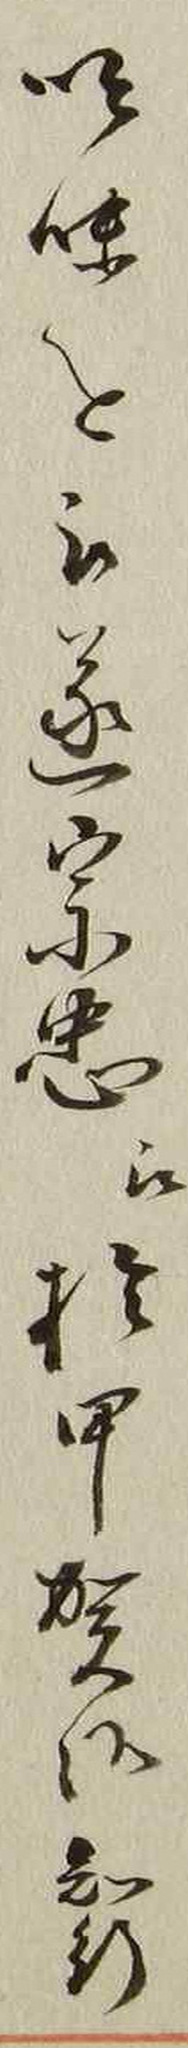吟味を被遂宗忠江於甲賀御知行
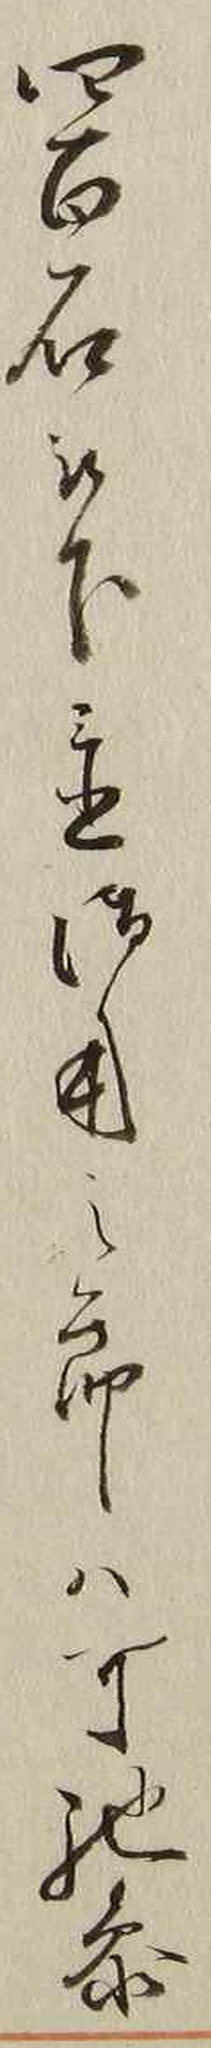四百石被下置御用之節は可馳参
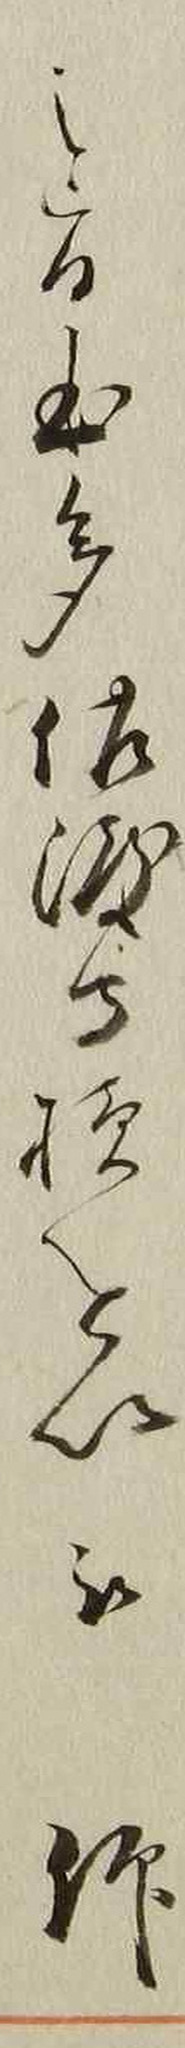之旨本多佐渡守様を以被仰
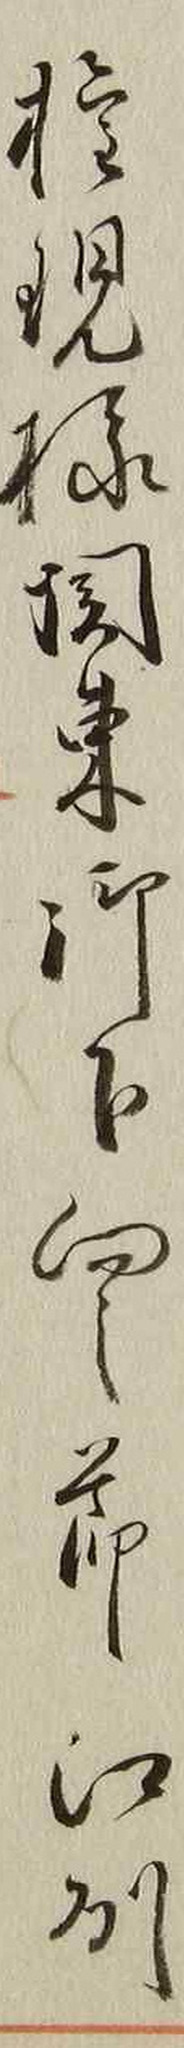権現様関東御下向之節江州
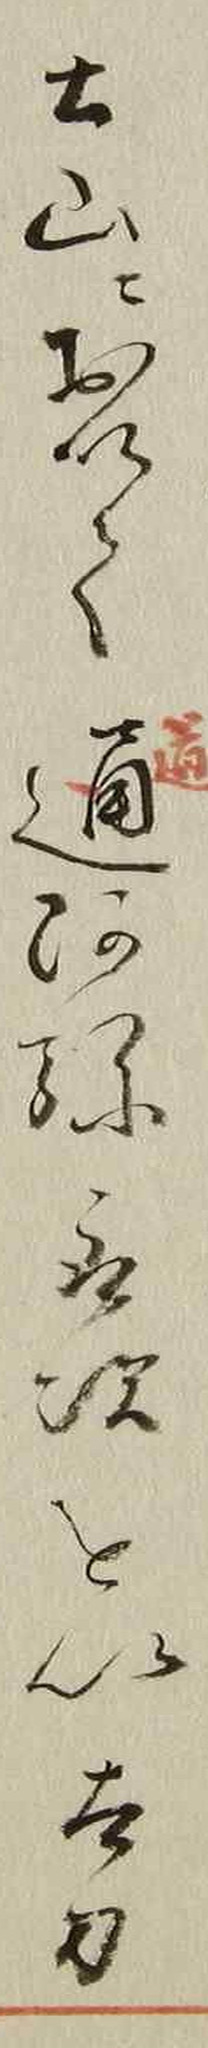古山ニおいて道阿弥取次を以太刀
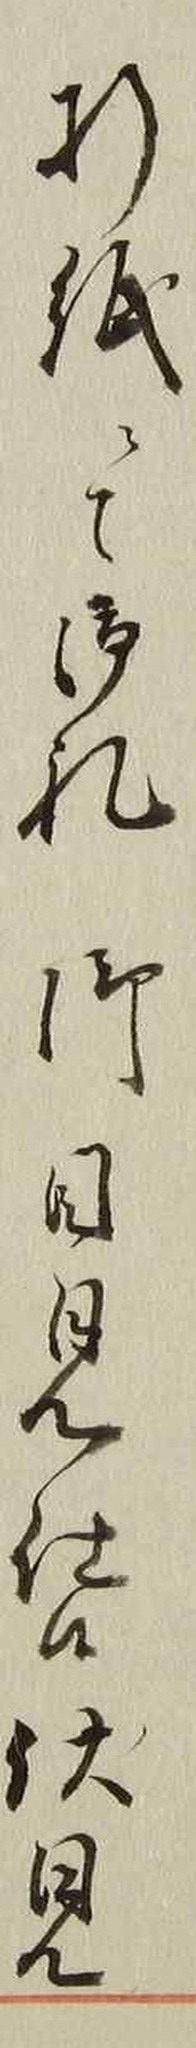折紙ニて御礼御目見仕候伏見
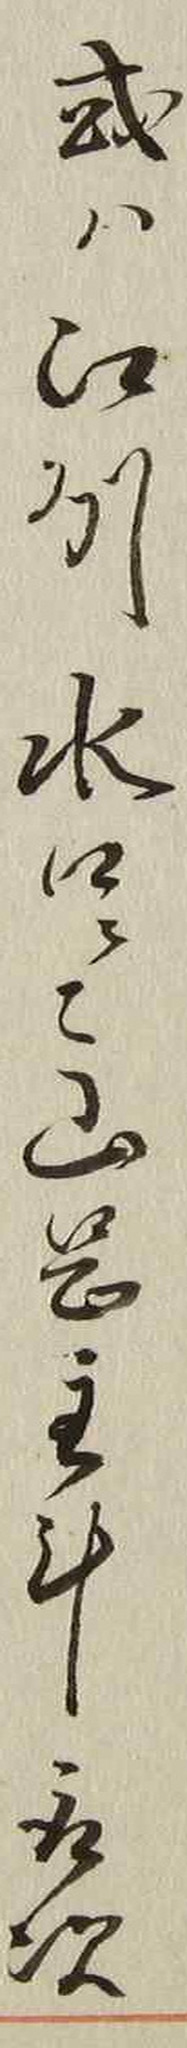或ハ江州水口ニて山岡主計取次
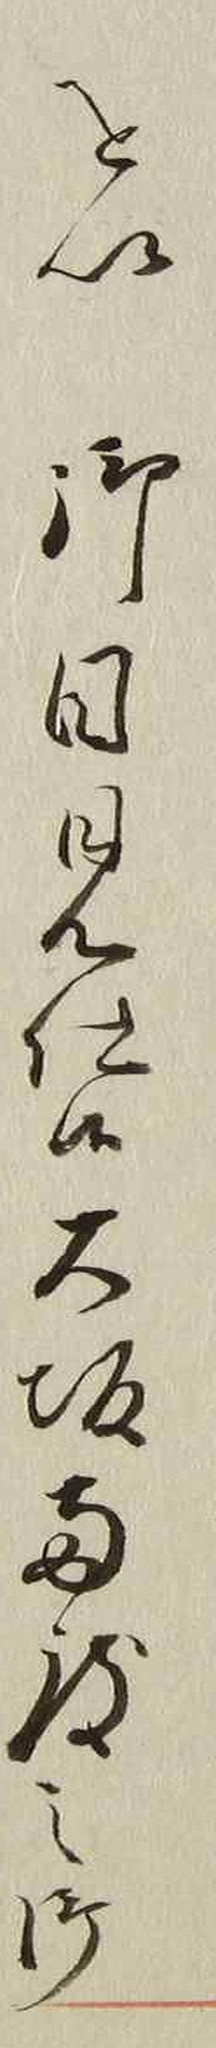を以御目見仕候大坂両度之御
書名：諸士系譜　巻之141　た之部17
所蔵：会津若松市立会津図書館
